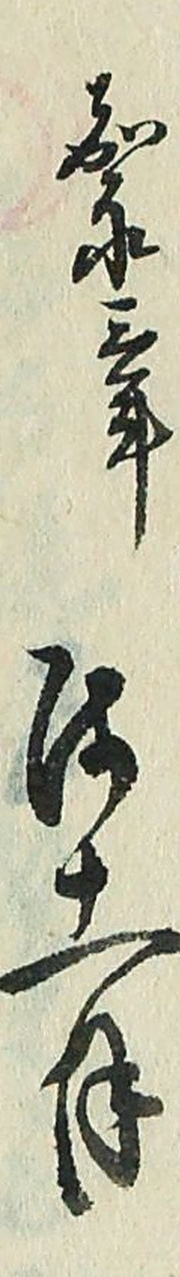嘉永三年戌十一月
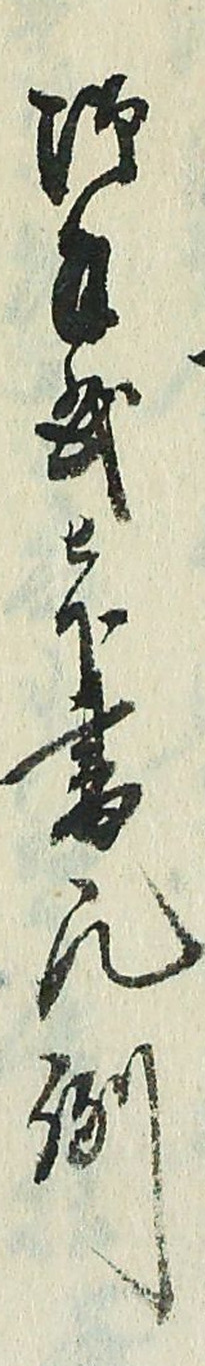御手當被下書凡例
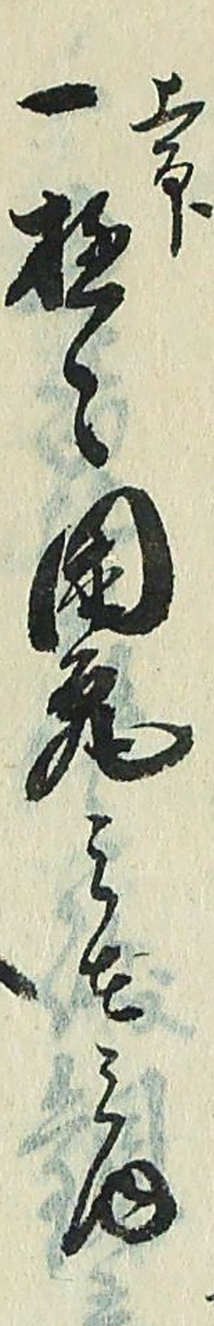一極々困窮之者之内
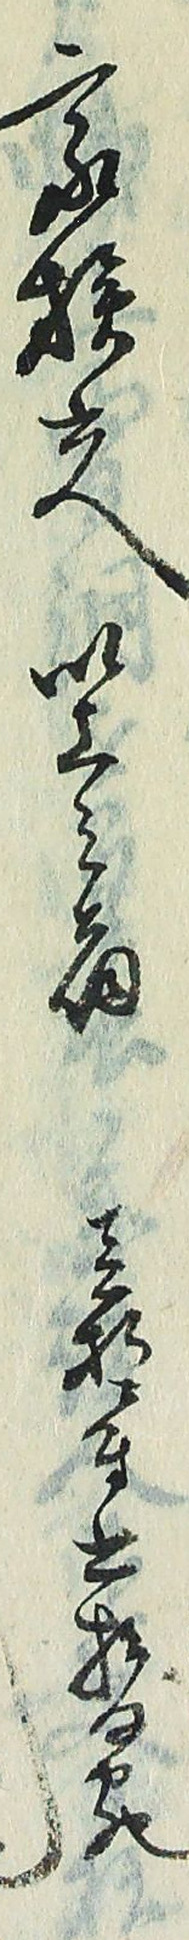家族六人以上之者壱軒ニ付六拾匁宛
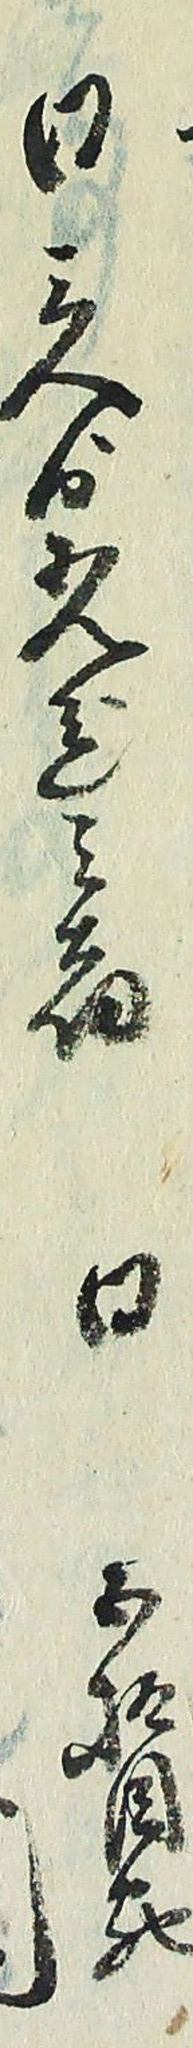同三人ゟ五人迄之者同五拾目宛
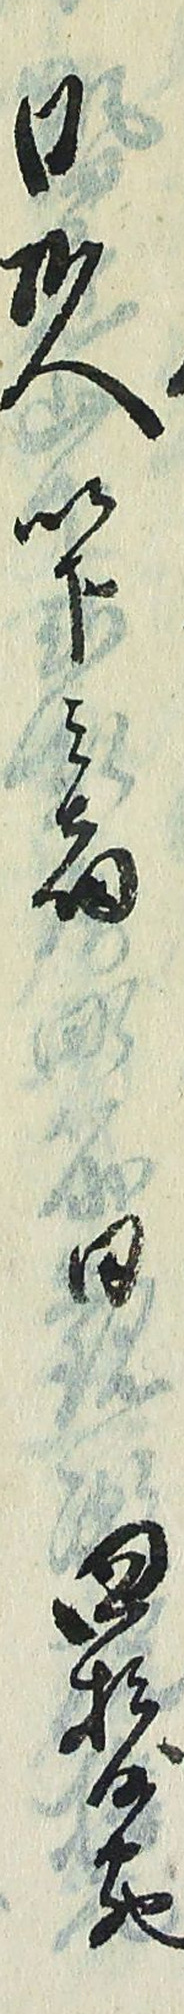同弐人以下之者同四拾匁宛
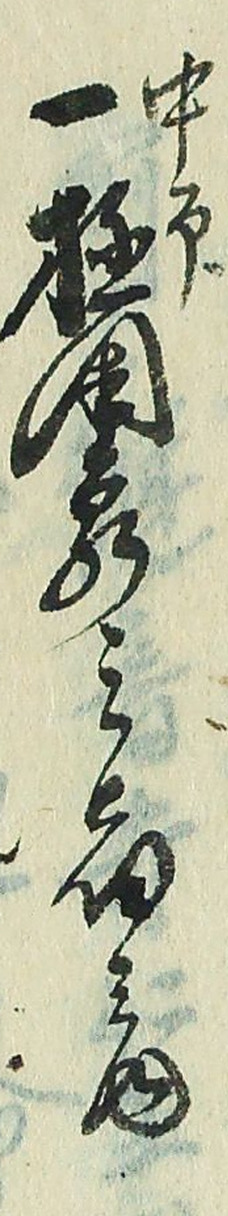一極困窮之者之内
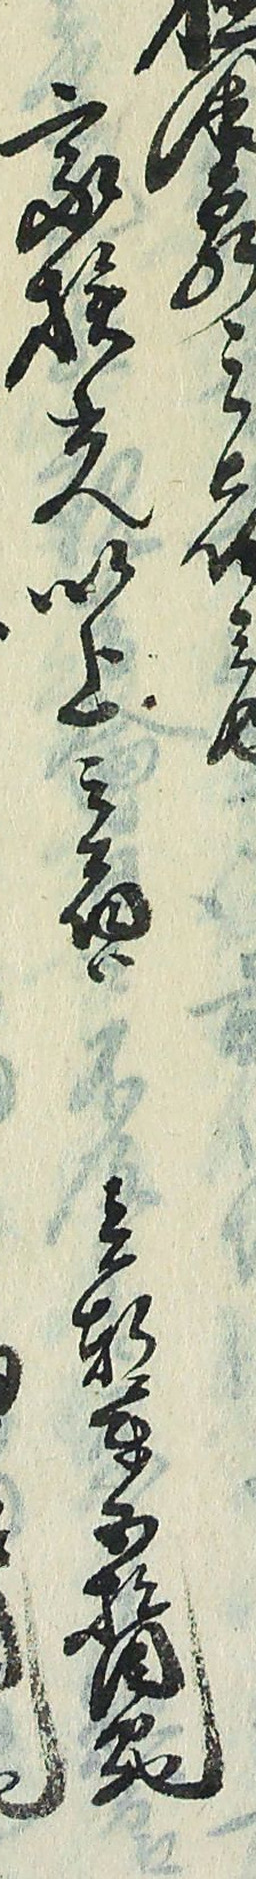家族六人以上之者壱軒ニ付五拾目宛
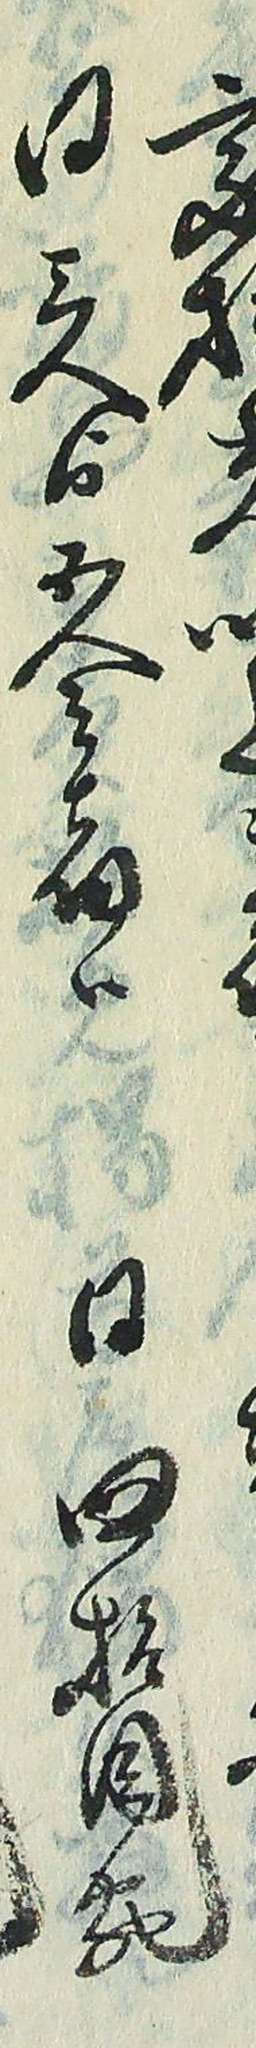同三人ゟ五人迄之者同四拾目宛
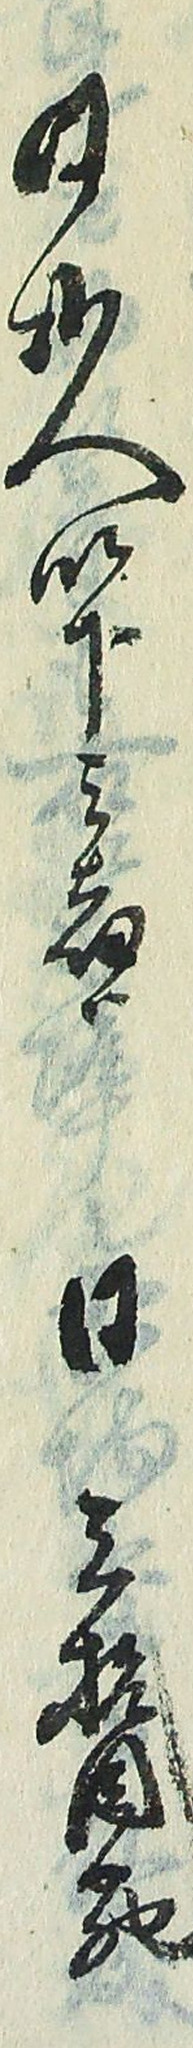同弐人以下之者同三拾目宛
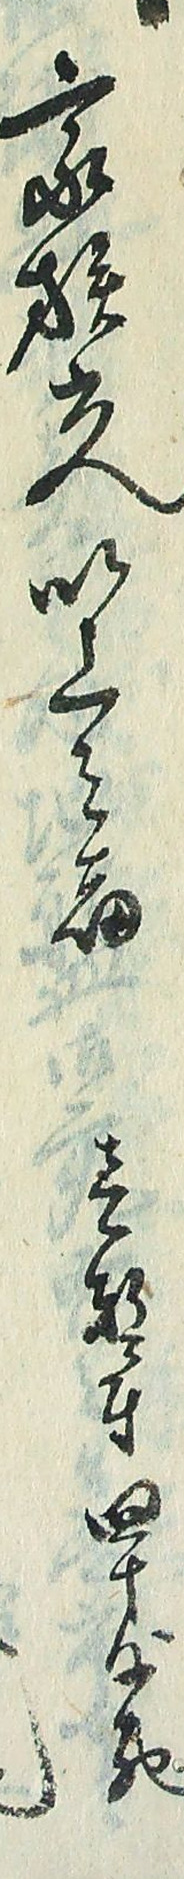家族六人以上之者壱軒ニ付四拾匁宛
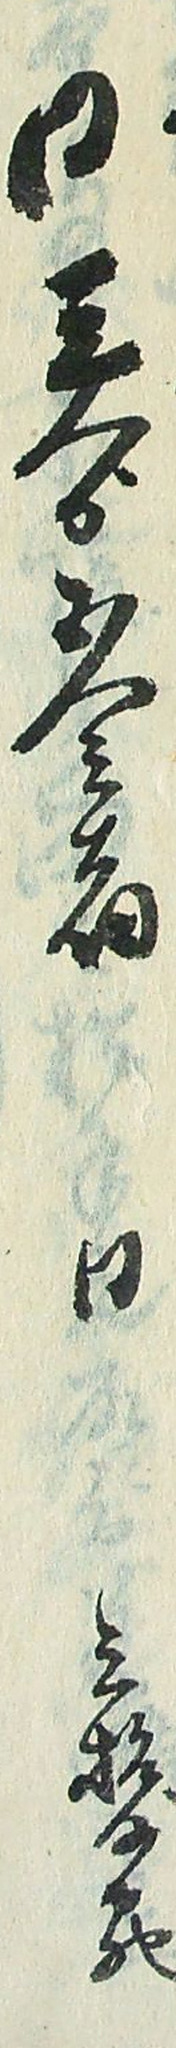同三人ゟ五人迄之者同三拾匁宛

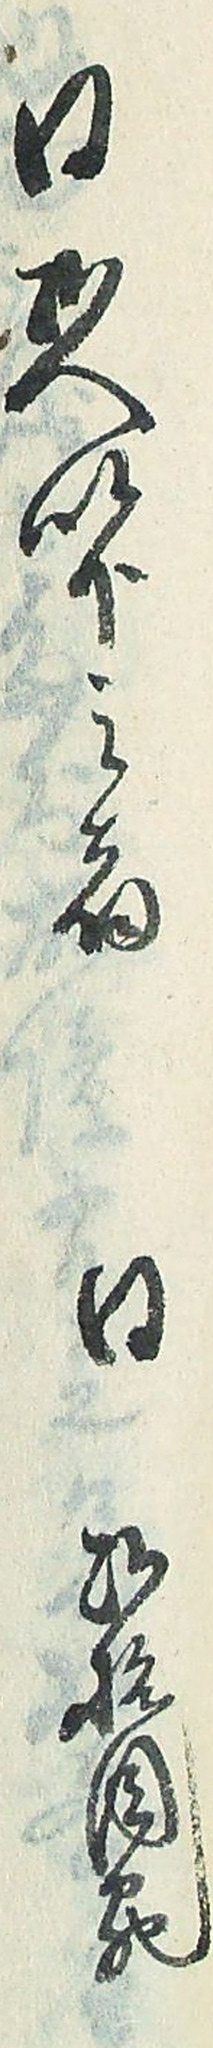同弐人以下之者同弐拾目宛
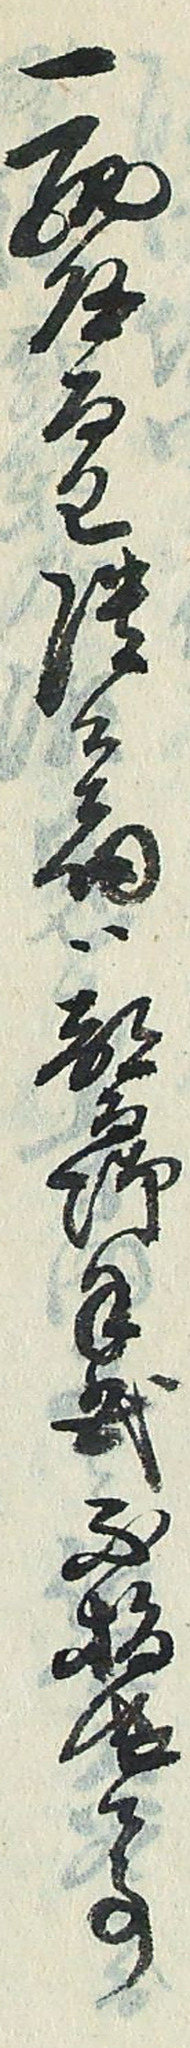一納屋而已潰候者ハ都而御手當不指遣候事
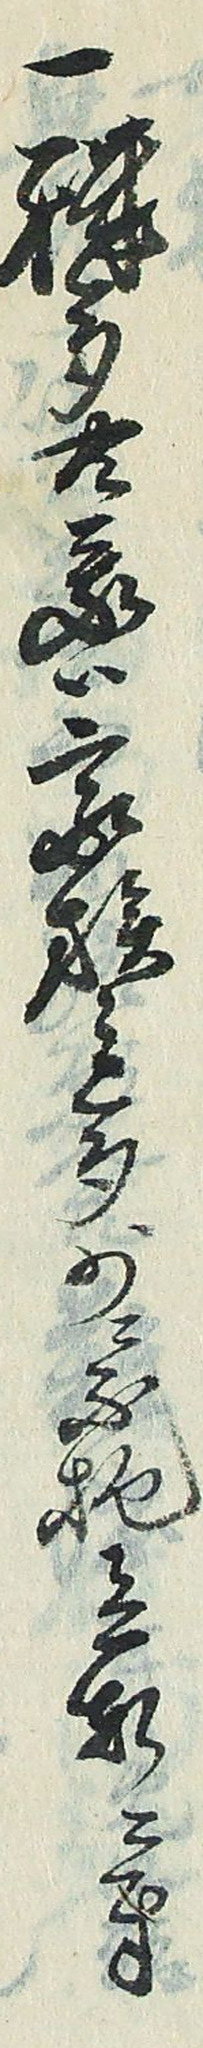一穢多共義ハ家族之多少ニ不拘壱軒ニ付
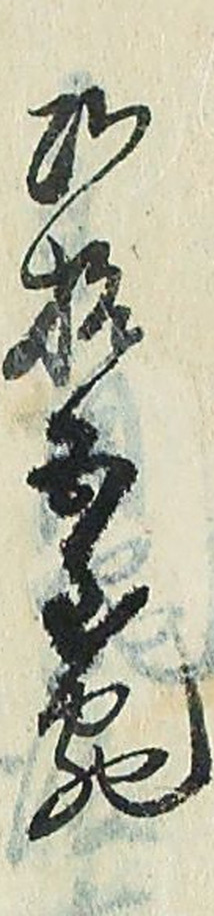弐拾五匁宛
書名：諸御趣意書并御下知向之写
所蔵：鳴門教育大学 Naruto University of Education
